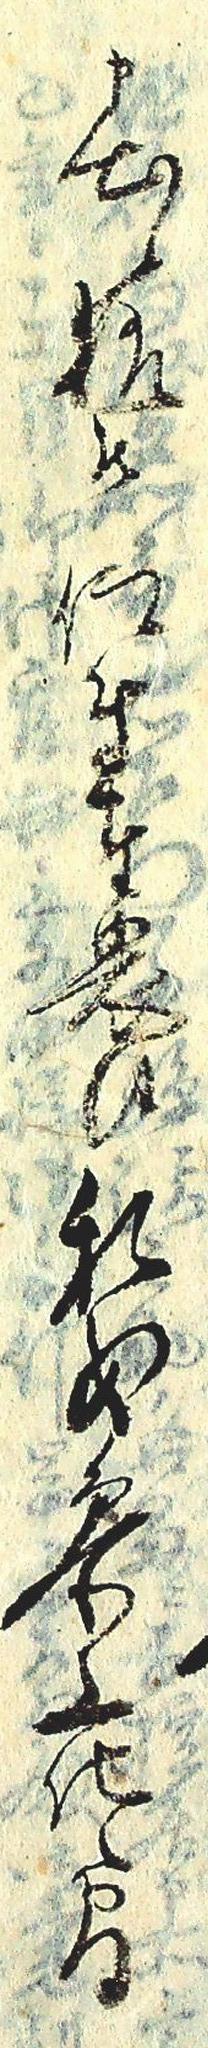申出候様被仰付奉畏候私義参上仕候間
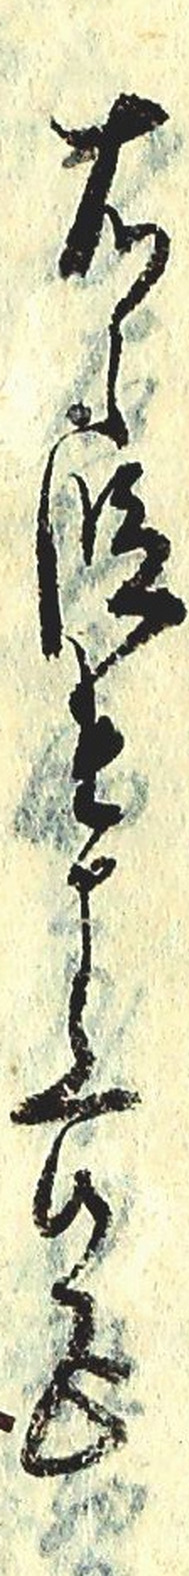右之段奉申上候以上
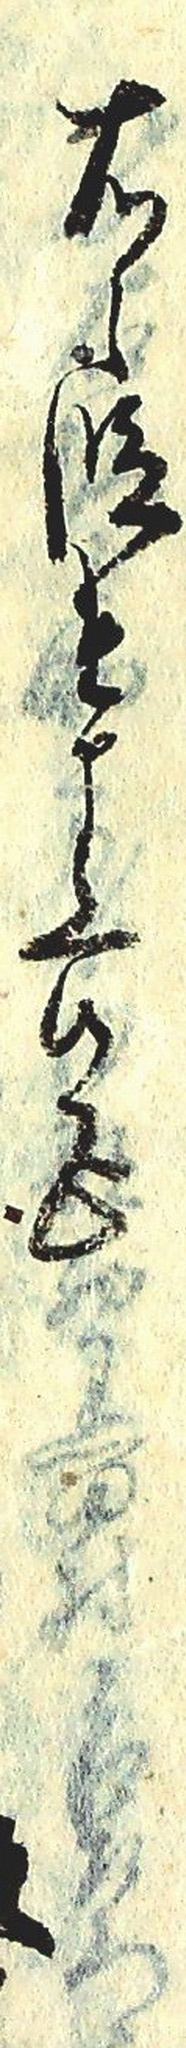右之段奉申上候以上
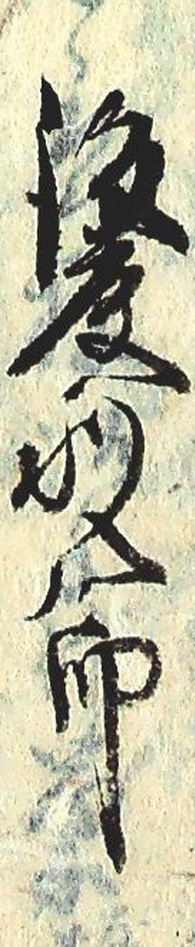後藤利八郎
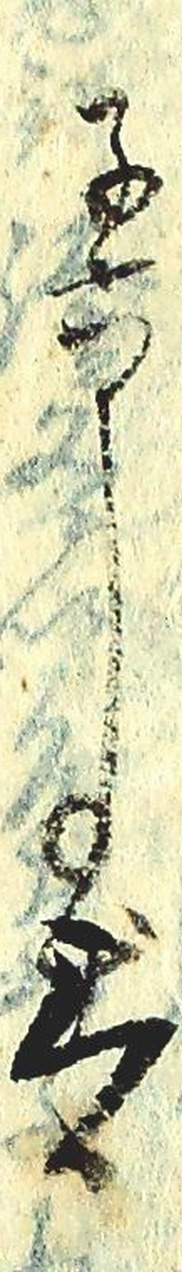子六月三日
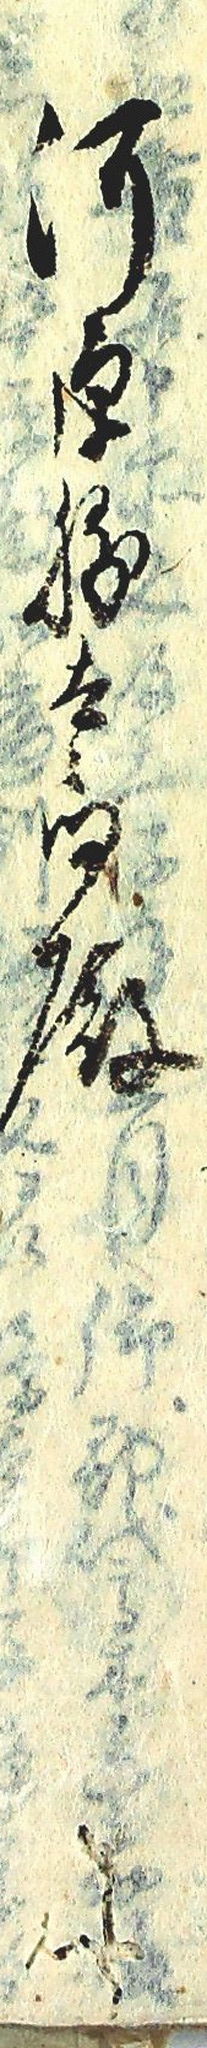河原勝太郎殿
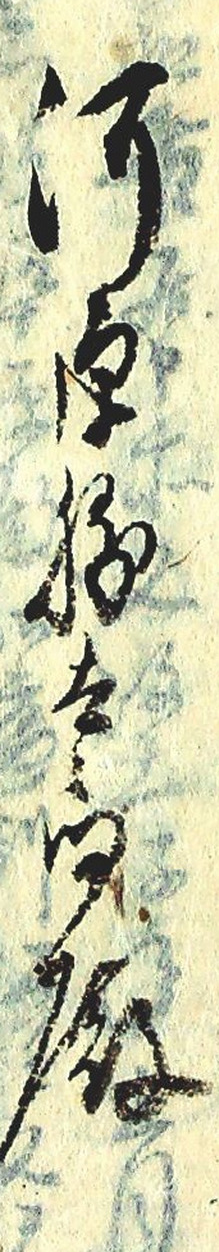河原勝太郎殿

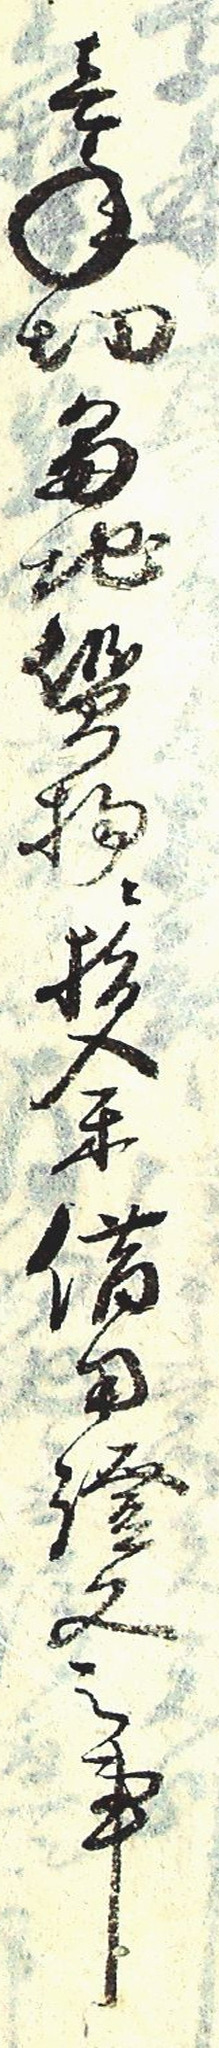壱年切畠地質物に指入米借用証文之事
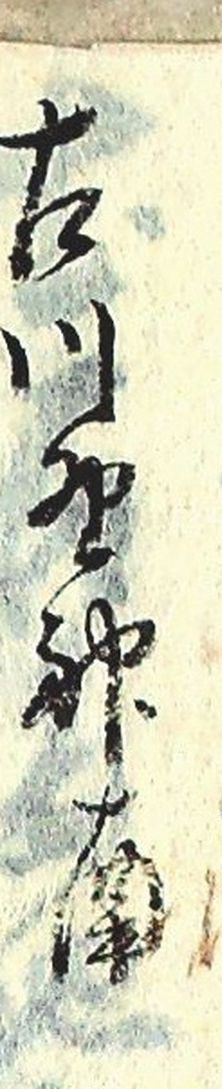古川野神南
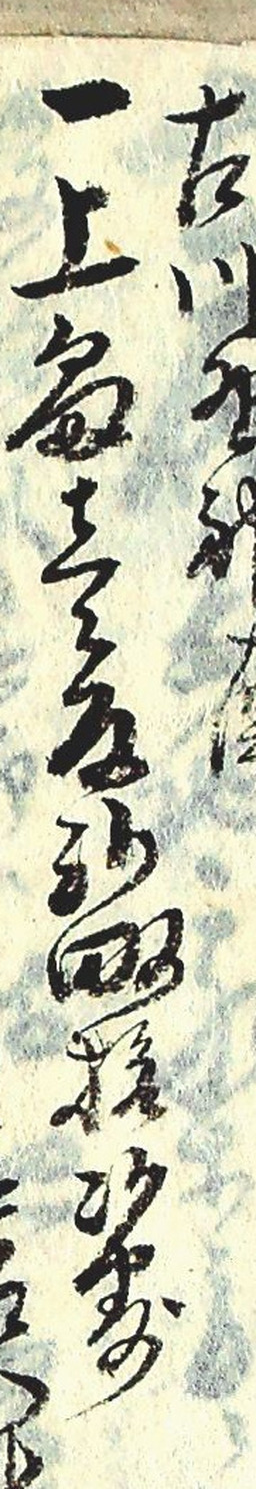一上畠壱反弐畝拾弍歩
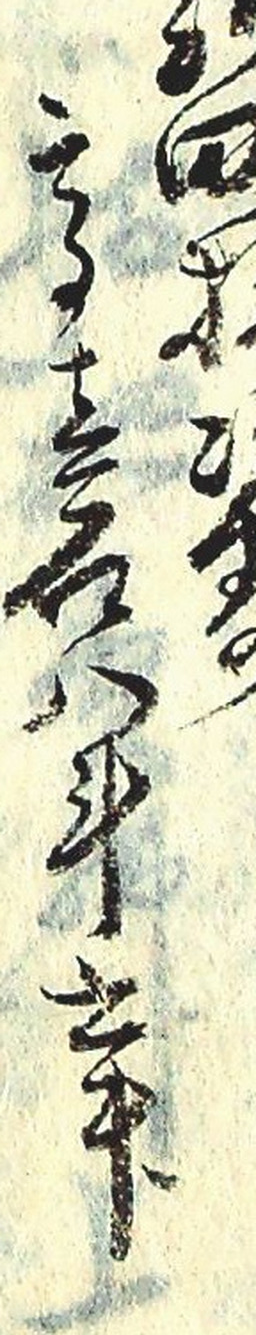高壱石八斗六升
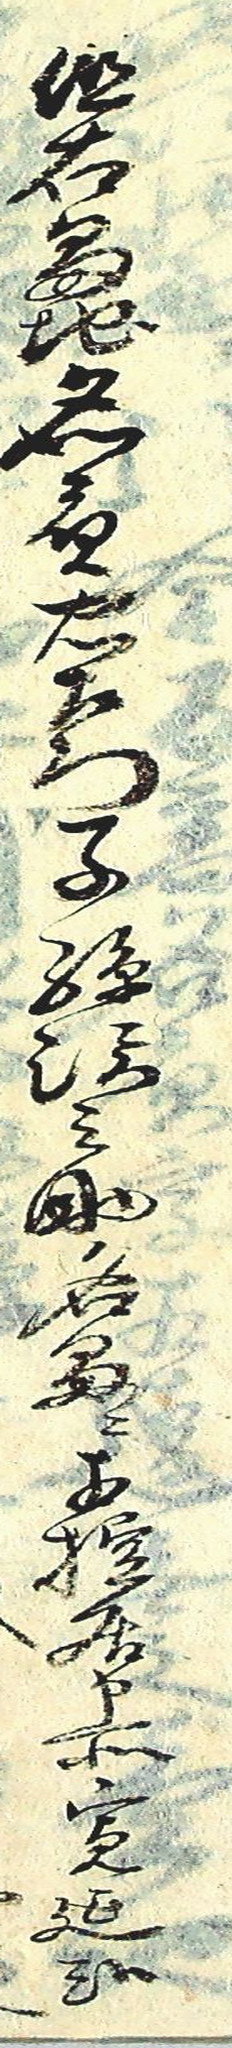但右畠地名負忠右衛門子孫沢之助名畠に相控居申所寛延弐
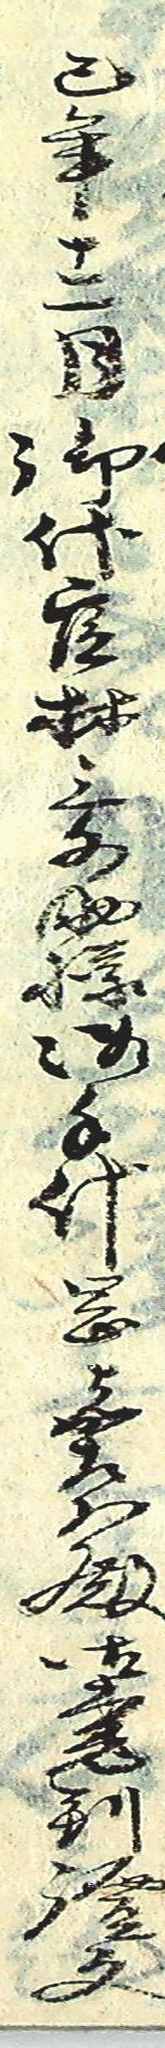巳年十二月御代官林乗助様御手代岡嘉左衛門殿御裏判証文
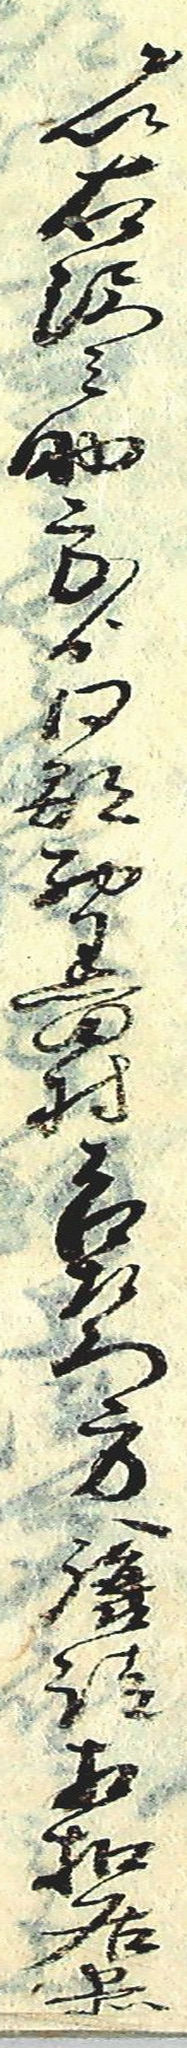を以右沢之助方ゟ同郡西黒田村吉左衛門方へ譲請相扣居申所
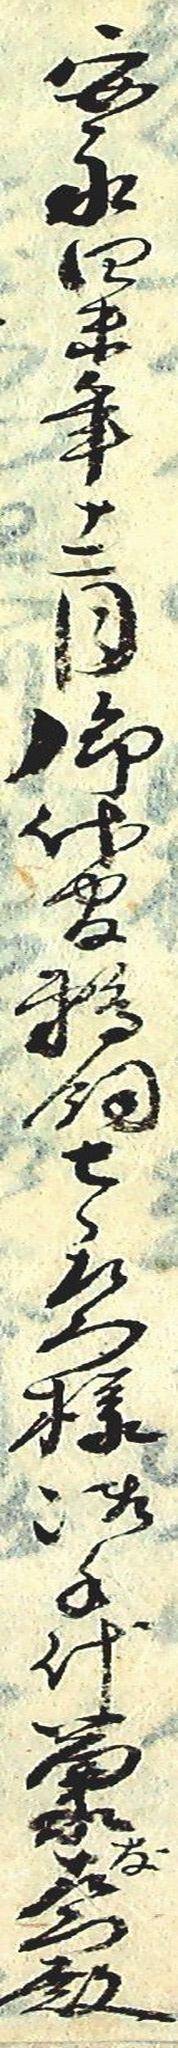安永四未年十二月御代官鵜飼七郎左衛門様御手代富永友左衛門殿
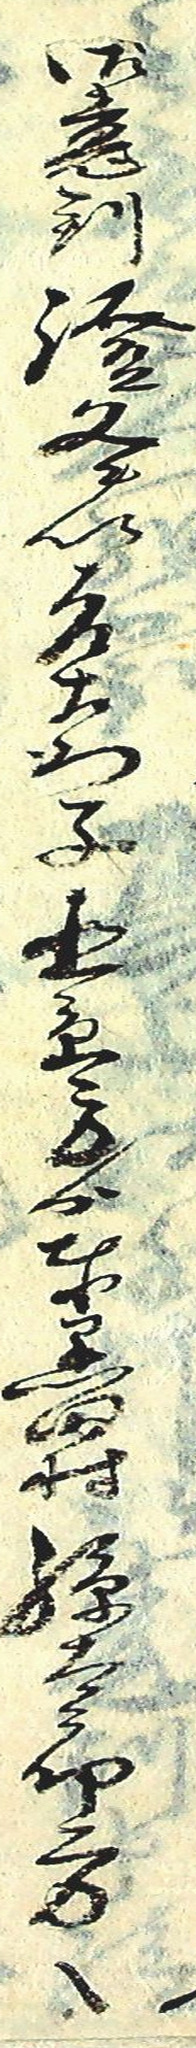御裏判証文を以吉左衛門子直兵衛方ゟ東黒田村孫太郎方へ
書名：諸御願書控(弐番）
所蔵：鳴門教育大学 Naruto University of Education
